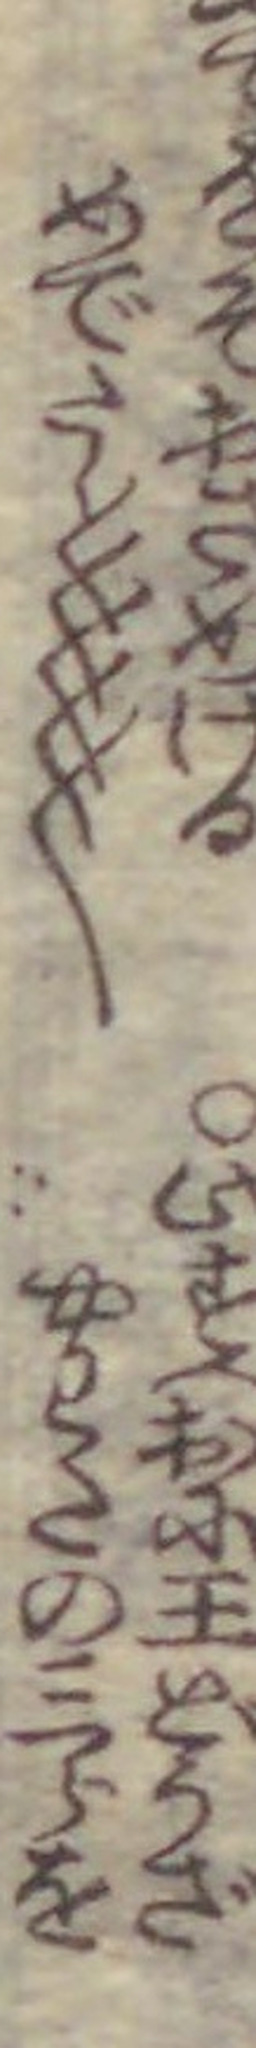めでたし〳〵〳〵〳〵〳〵〳〵
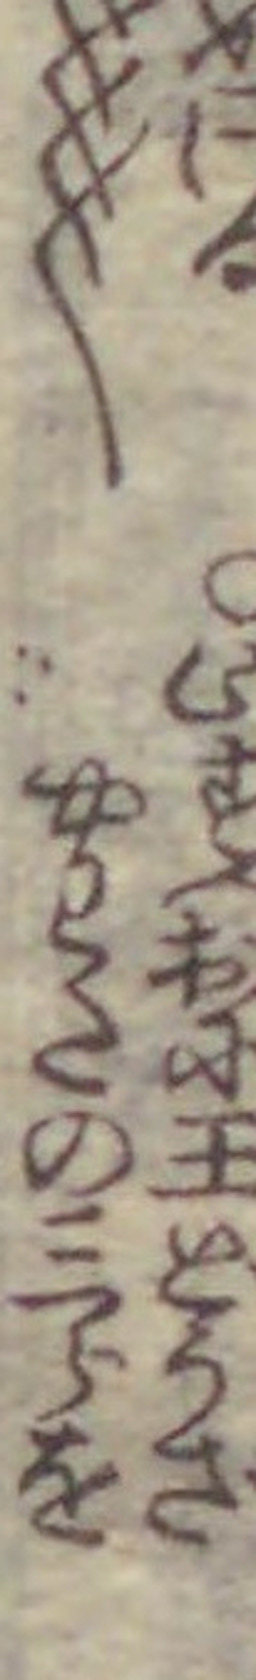やわたの三郎を
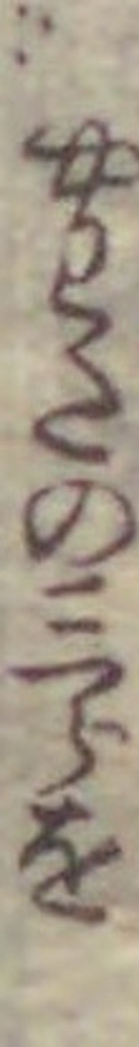やわたの三郎を
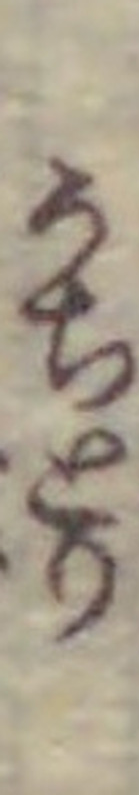うちとり
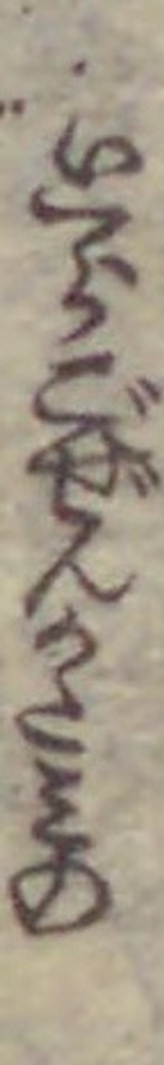とらごぜんかたみの
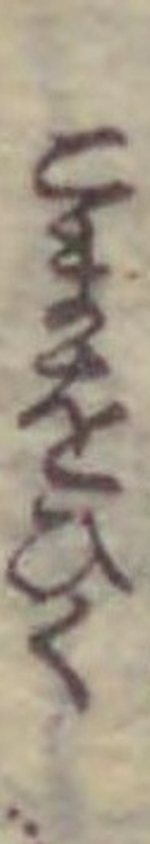こまをひく
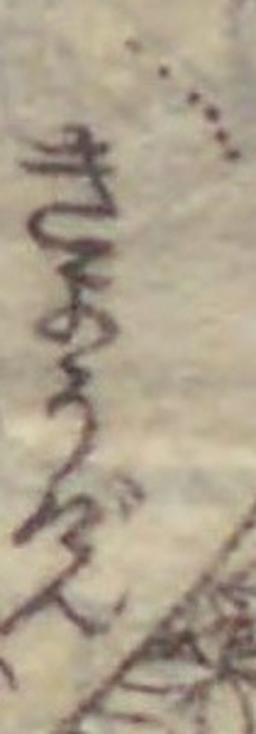きようげん
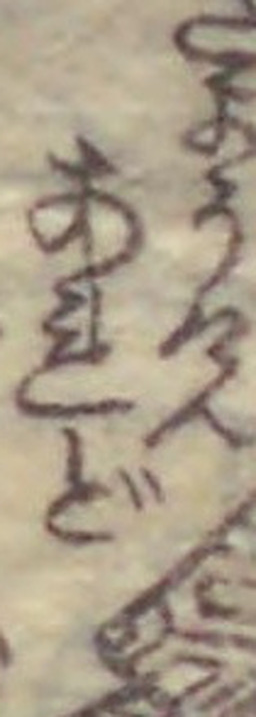あれど
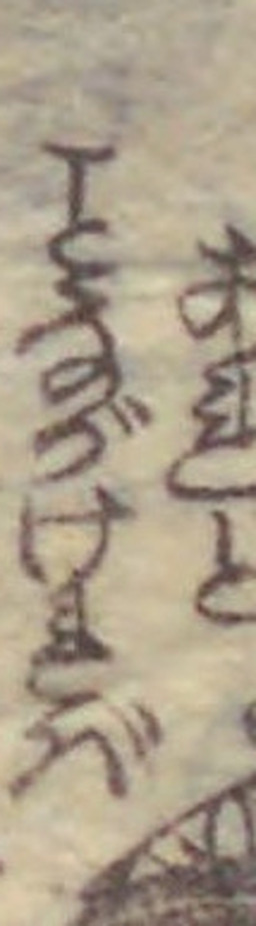ことながければ
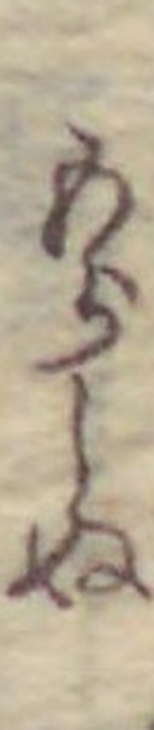もらしぬ
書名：大時代唐土化物 3巻. 曽我太夫染
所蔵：国立国会図書館 National Diet Library, JAPAN
